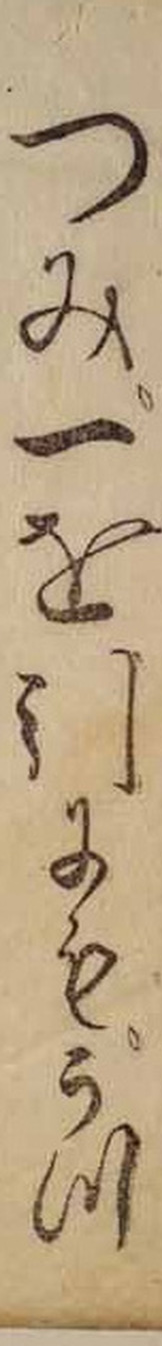つみ。一を引にも。うつ
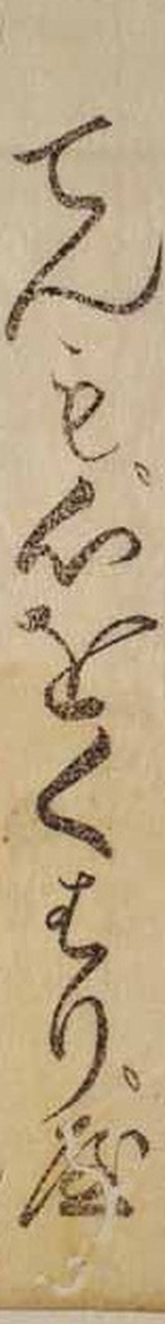てんも。心をくはり。や
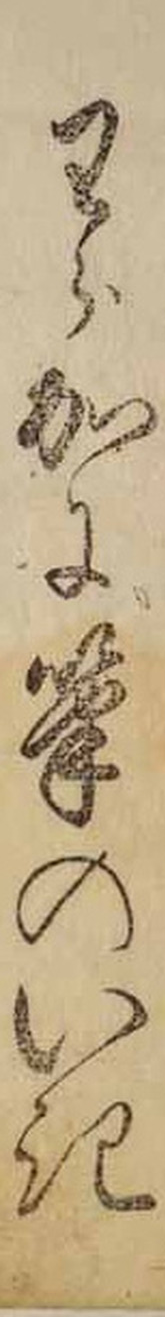わらかに。筆のいき
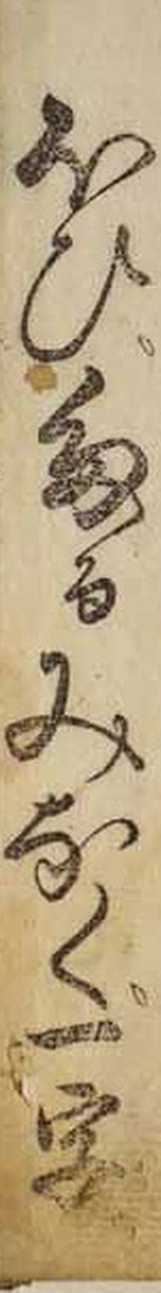ほひ。たるみなく。一字

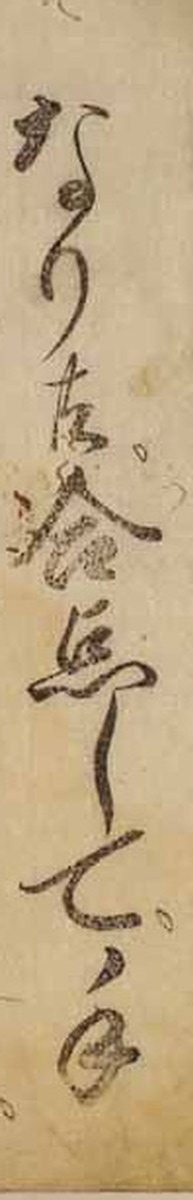なり共。合点して。手
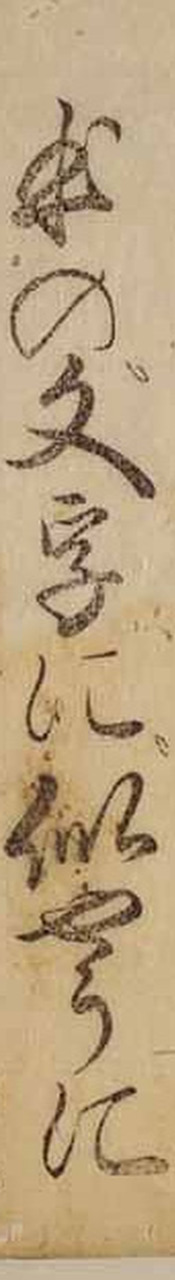本の文字に似やうに。
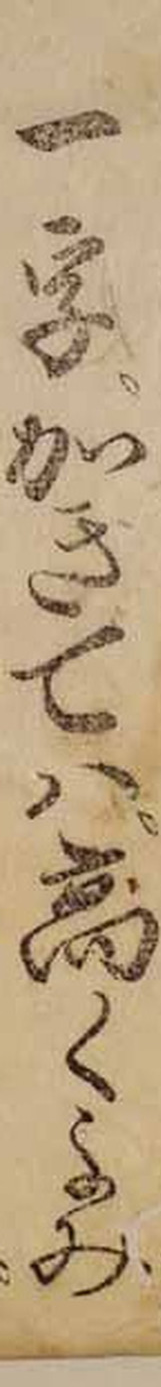一字。かきては。高くよみ。
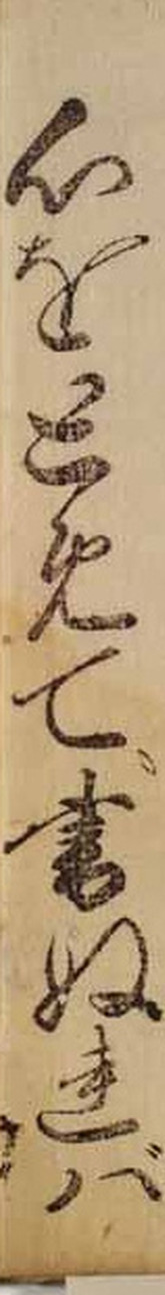心をとめて。書ぬれば。
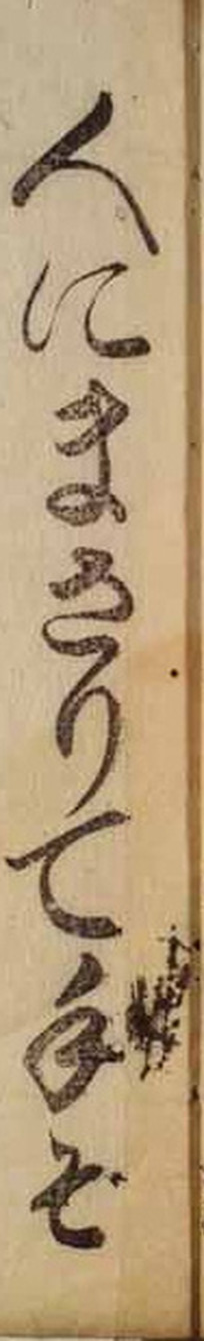人にまさりて手ぞ
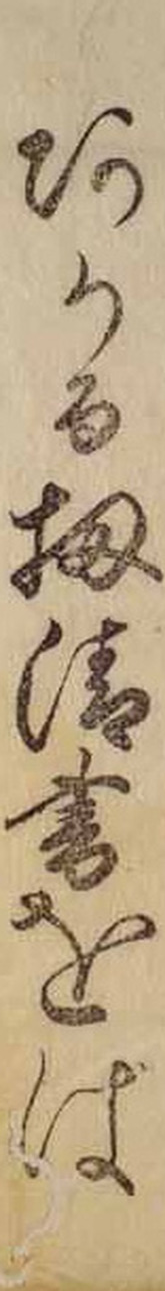あかる扨清書をは
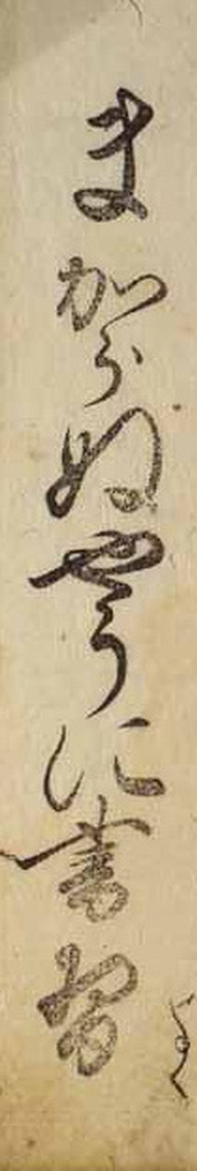まからぬやうに書習

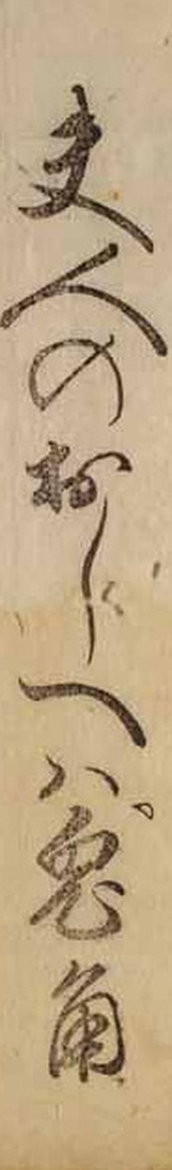夫人のおしへは。兎角
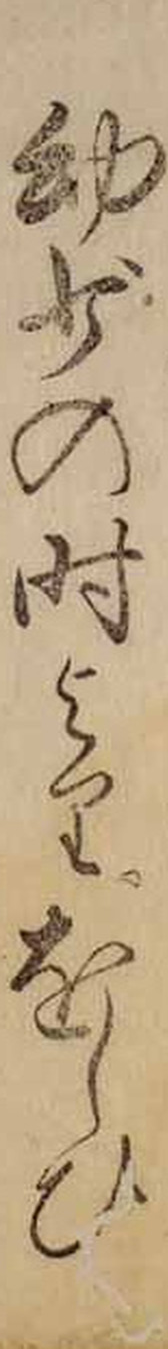幼少の時より。をしひ
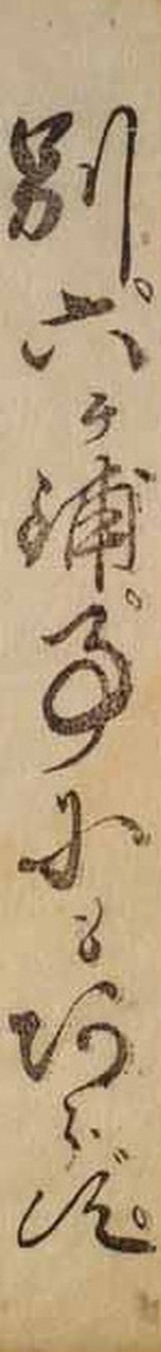別。六ヶ鋪。事にもあらず。
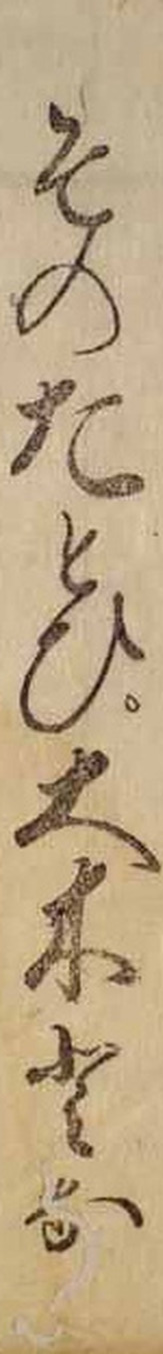そのたとひ。大木とな
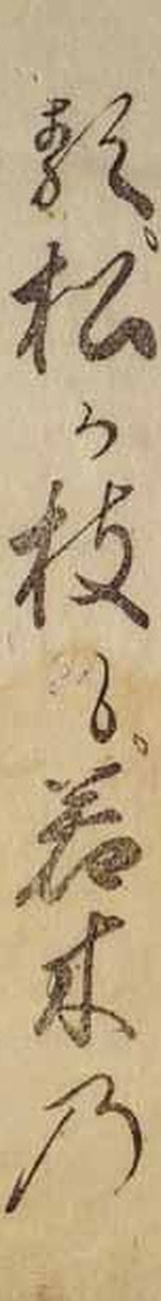る。松か枝も。若木の
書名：寺子躾方
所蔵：東京学芸大学教育コンテンツアーカイブ
